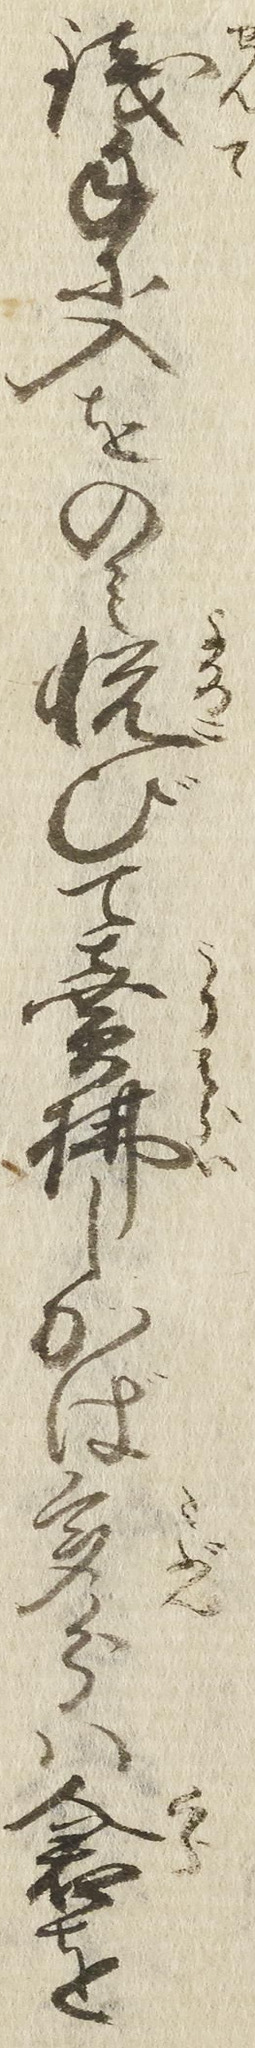銭手に入をのみ悦びて売払しかは多分は倉を
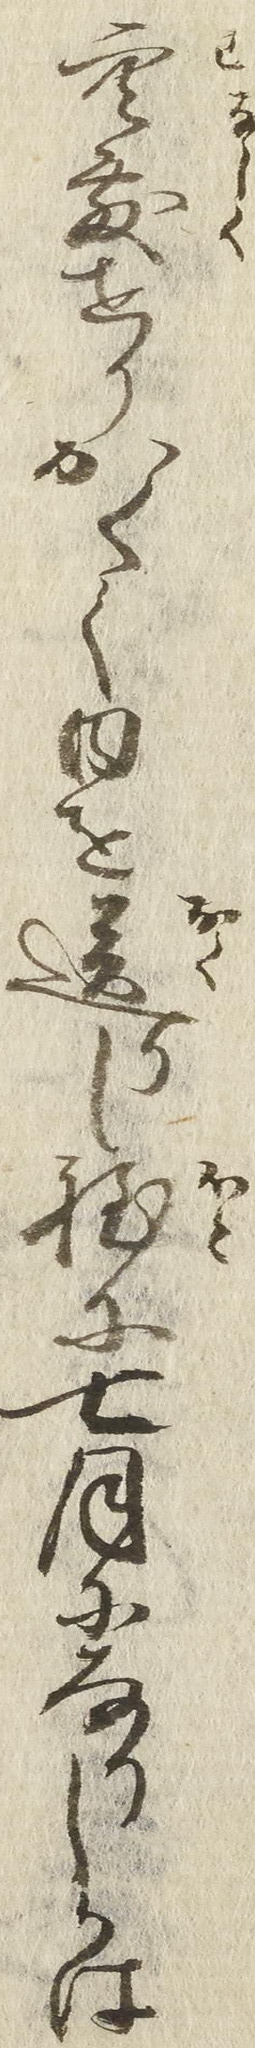空敷せりかくて日を送りし程に七月になりしかは
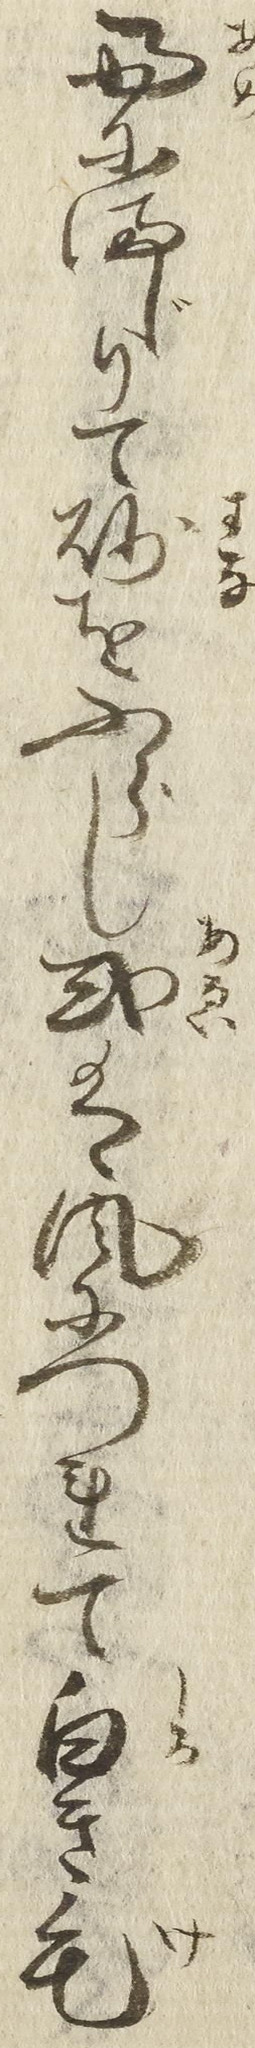雨にまじりて砂をふらし或は風につれて白き毛
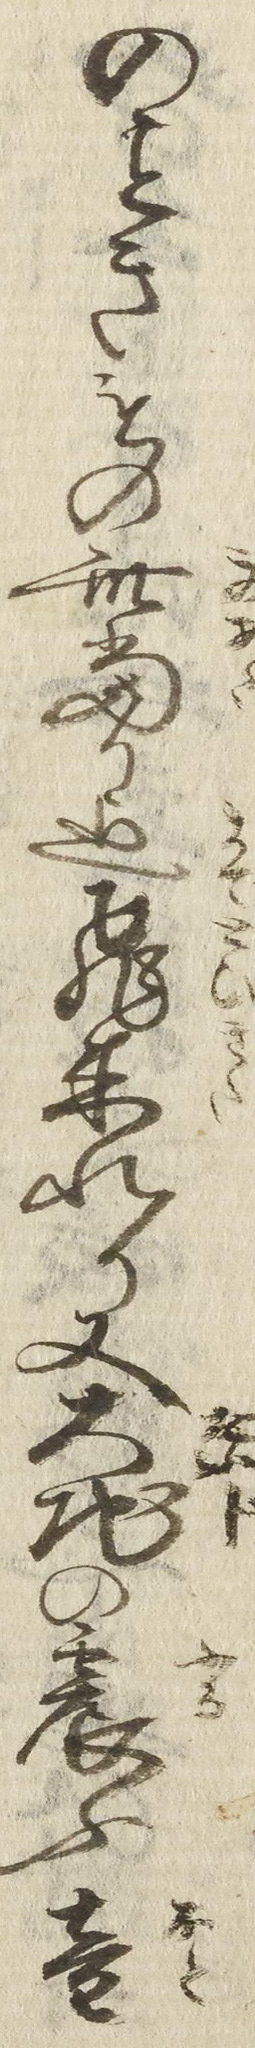のこときもの此当り迄飛来れり又大地の震ふ音
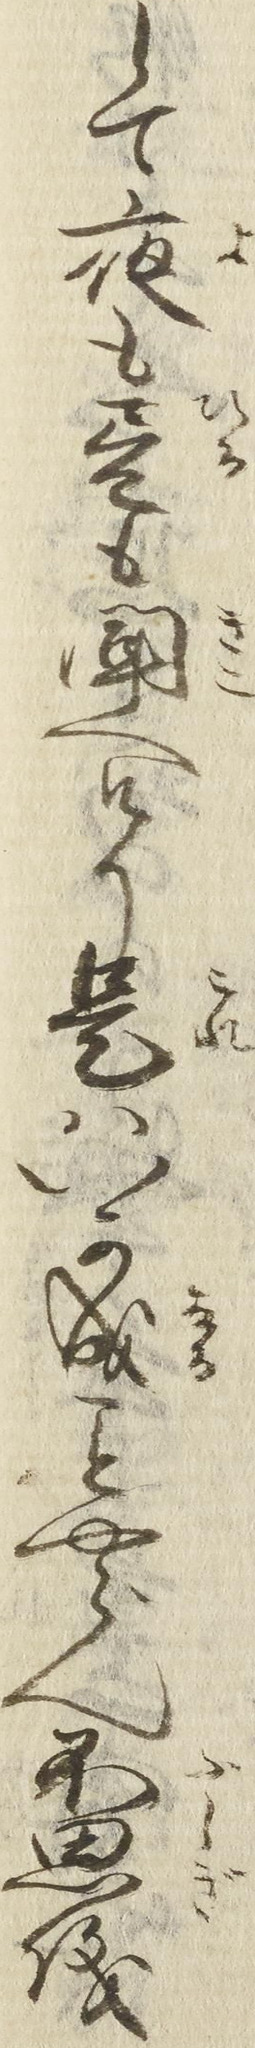して夜も昼も聞へけり是はいか成ことやらん不思儀
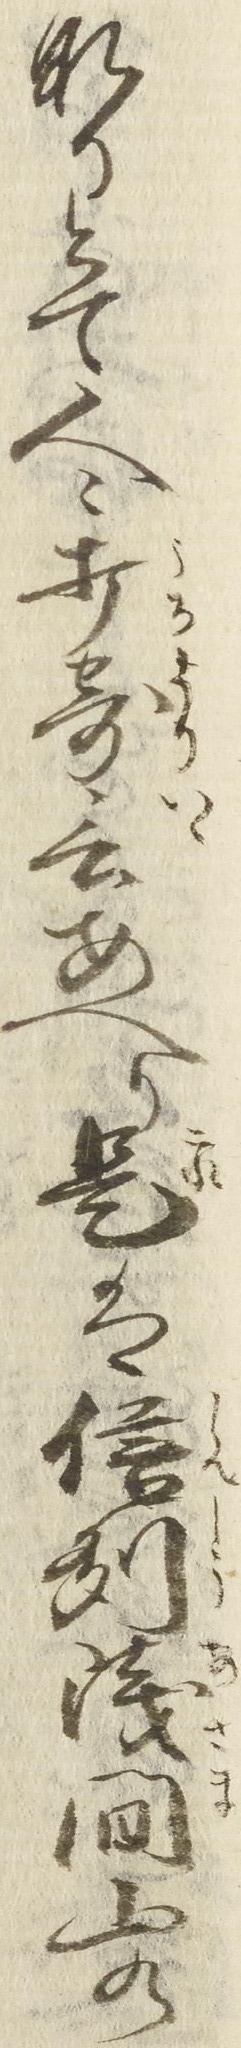なりとて人〻打寄言あへり是は信州浅間山の
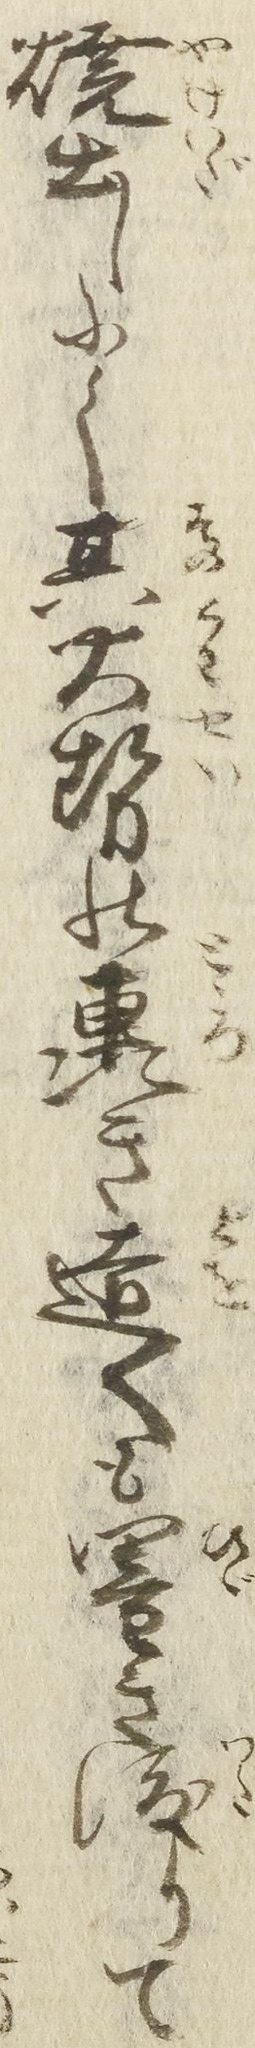焼出しにて其火勢の轟き遠くも響き渡りて
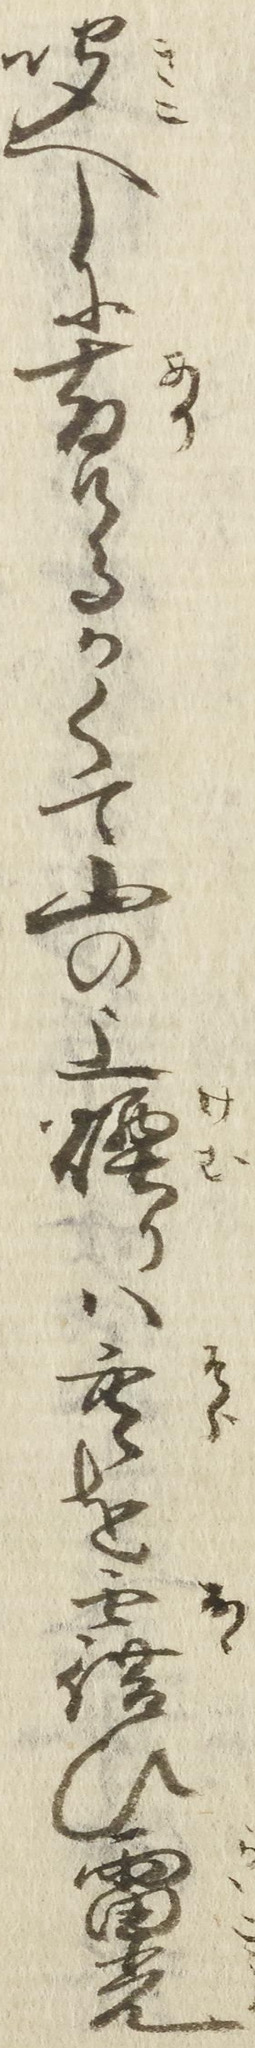聞へしに有けるかくて山の上煙りは空を覆ひ雷光
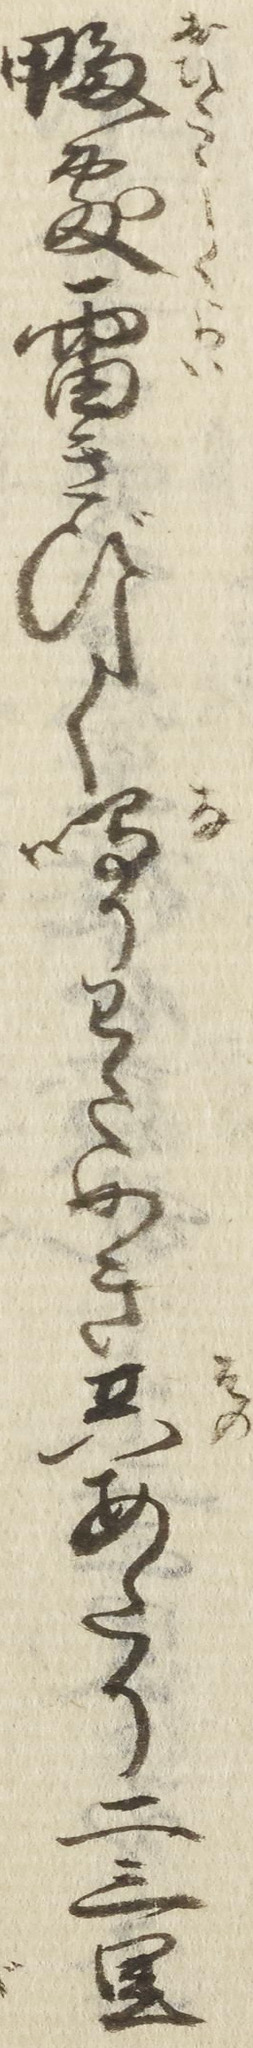夥敷雷きびしく鳴りわためき其あたりニ三里
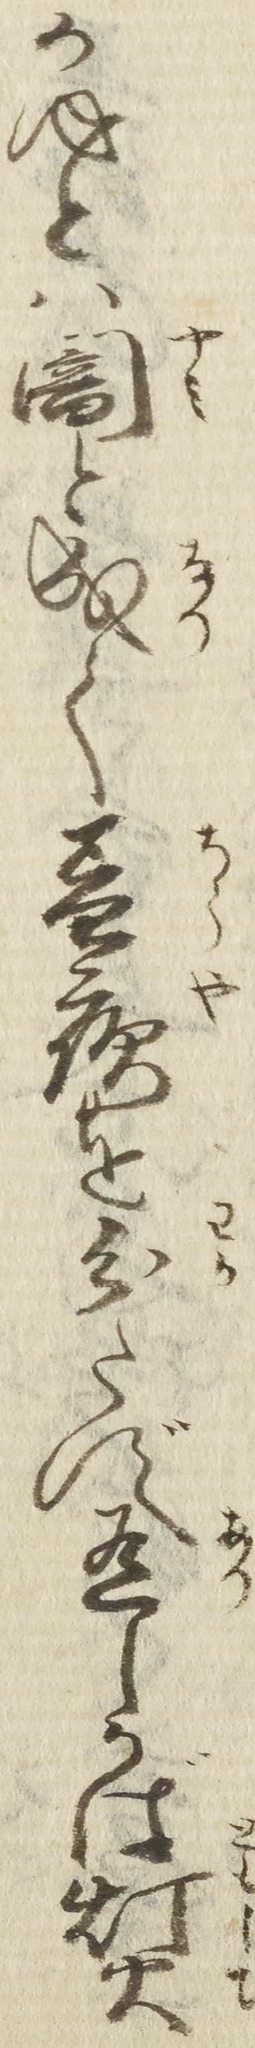か内とは闇と成て昼夜を分たず有しかは灯火
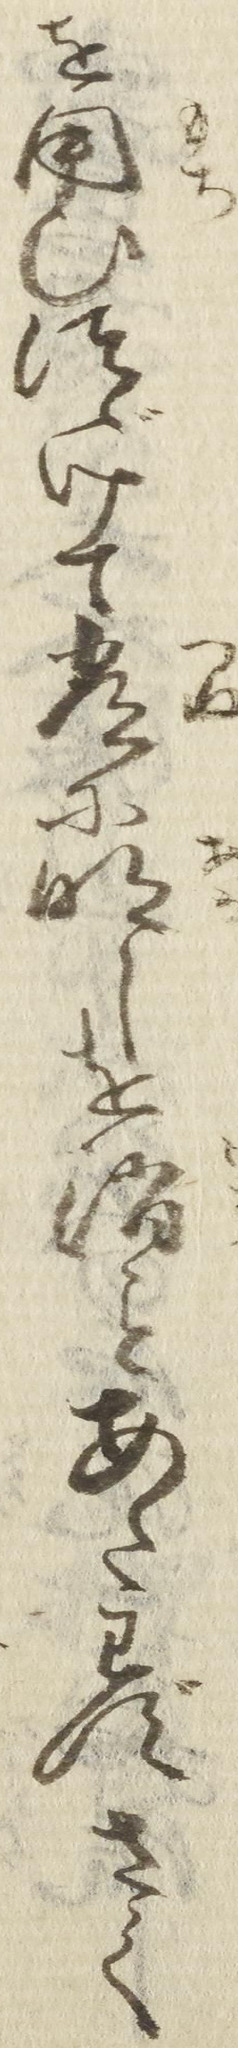を用ひつゞけて常に明しを消ことあたわずさて
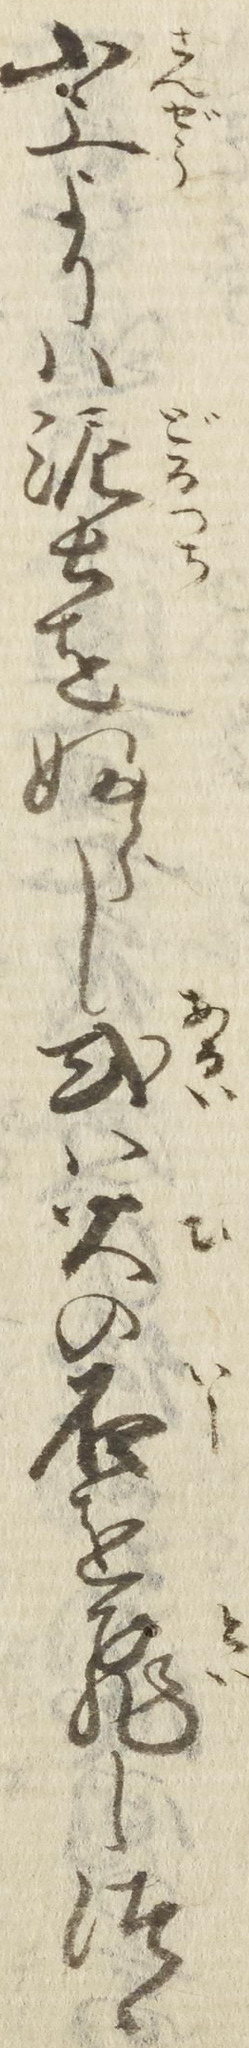山上よりは泥土をふらし或は火の石を飛しつゝ
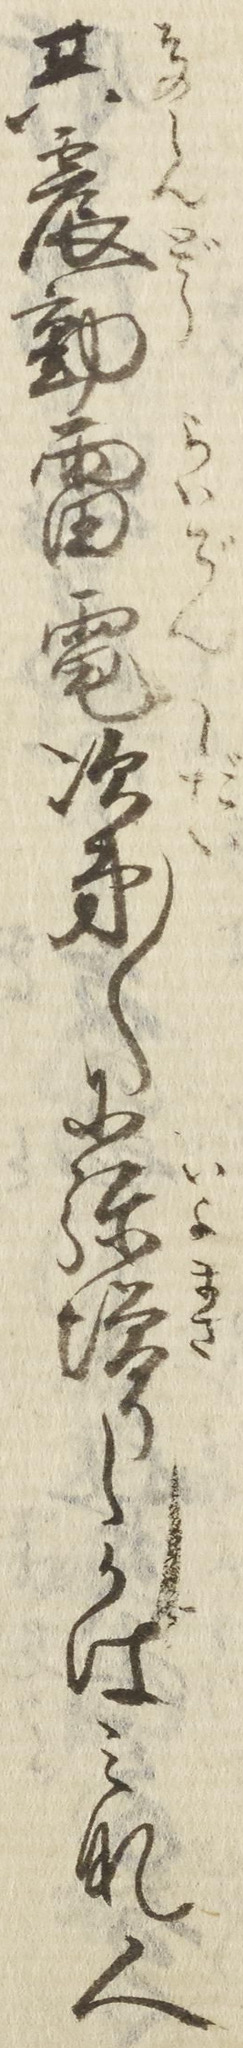其震動雷電次第〳〵に弥増りしかばみな人

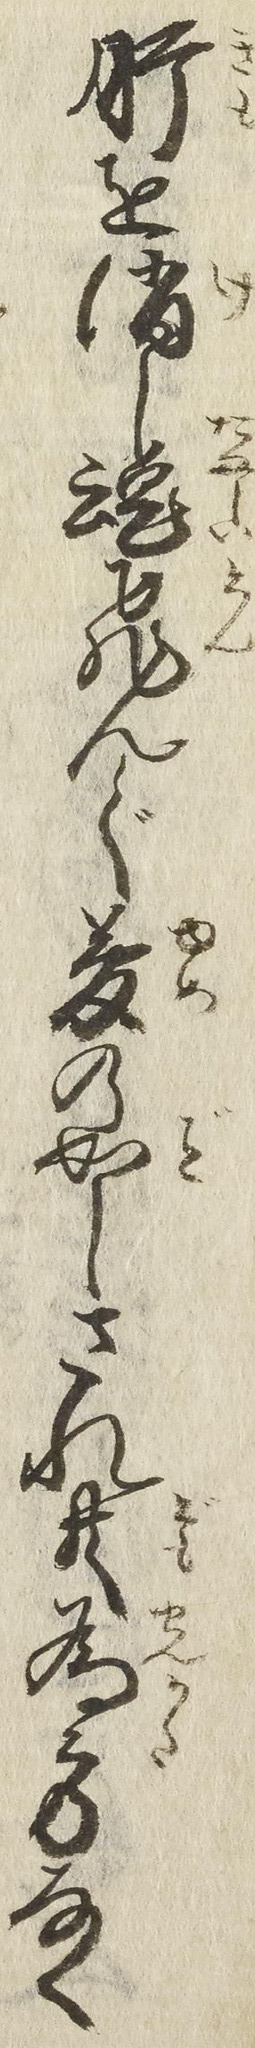肝を消し魂飛んで夢の如しされ共為方なく
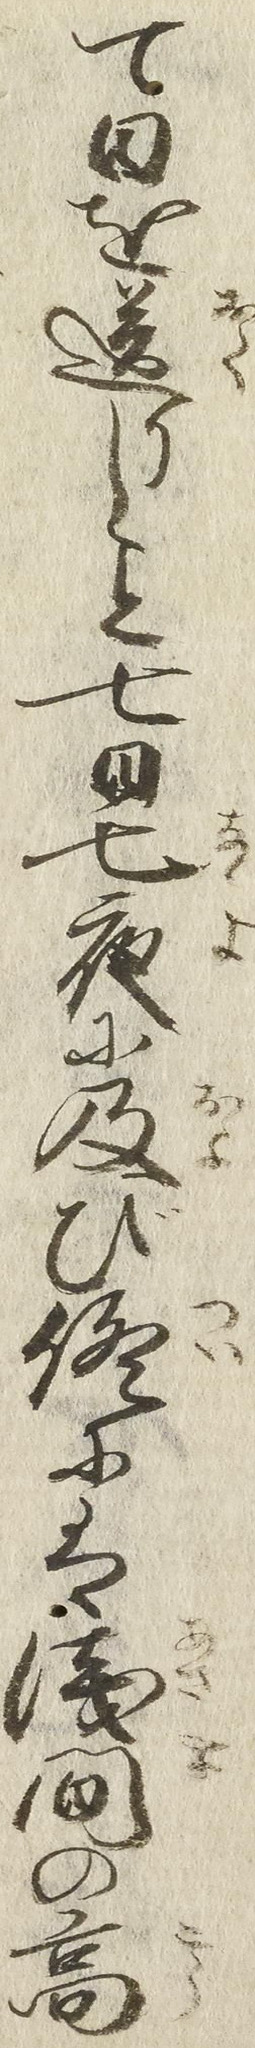て日を送りしこと七日七夜に及び終には浅間の高
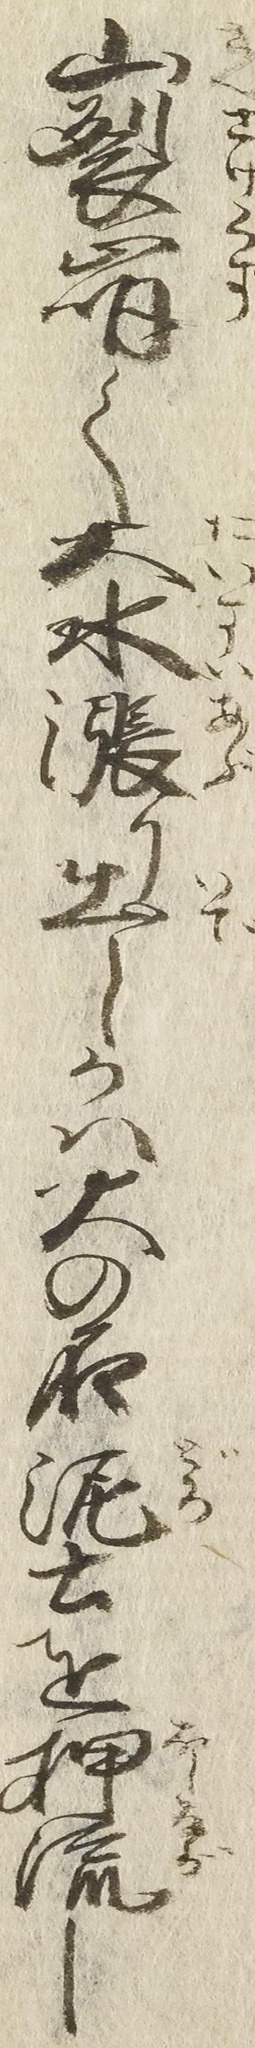山裂崩て大水漲り出しかは火の石泥土を押流し
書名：天明奇畧　全
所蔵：東京大学地震研究所図書室 Earthquake Research Institute Library, The University of Tokyo, JAPAN
